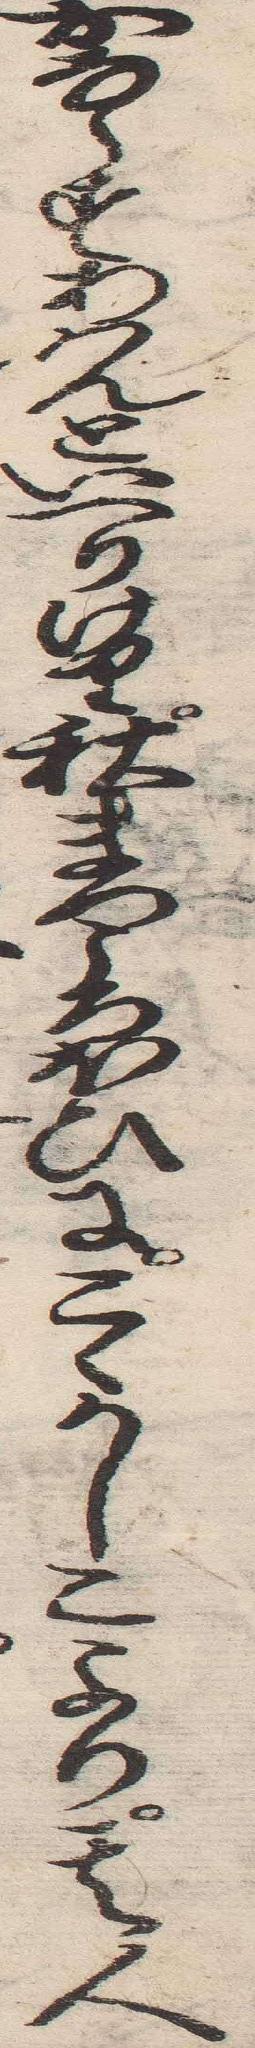かならすあはんといへりけり。秋まつころほひに。こゝかしこより。其人
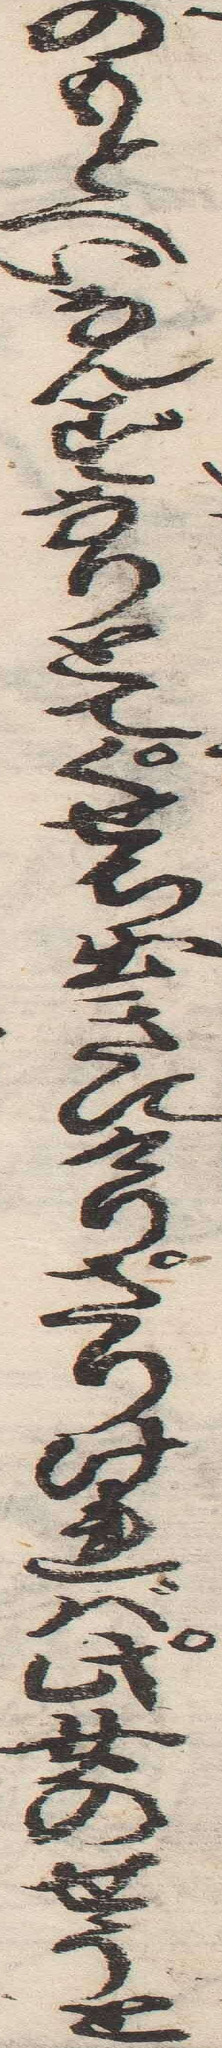のもとへいなんずなりとて。くせち出きにけり。さりければ。此女のせうと
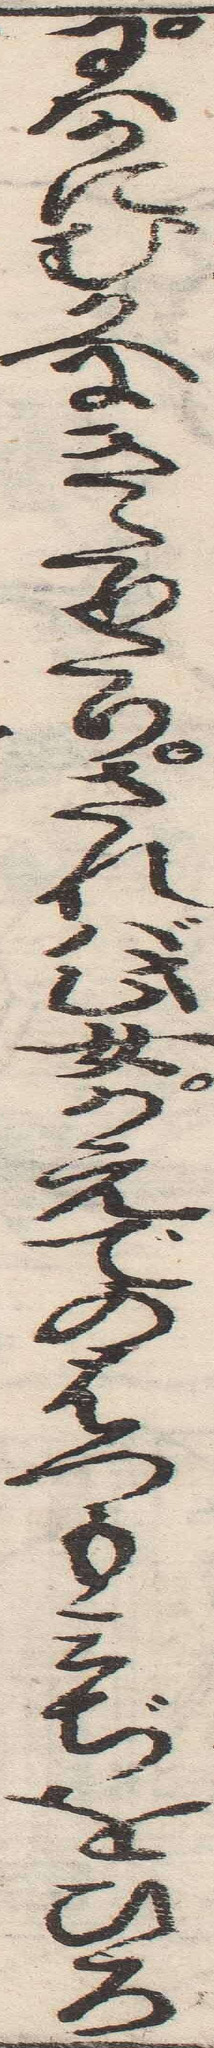。にはかにむかへにきたりたり。されば此女。かえでのはつもみぢをひろ
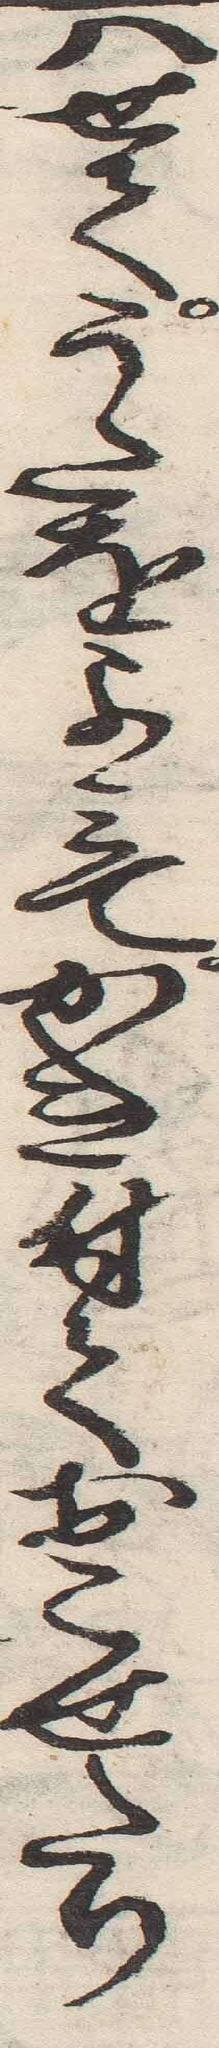はせて。うたをよみて。かき付ておこせたり
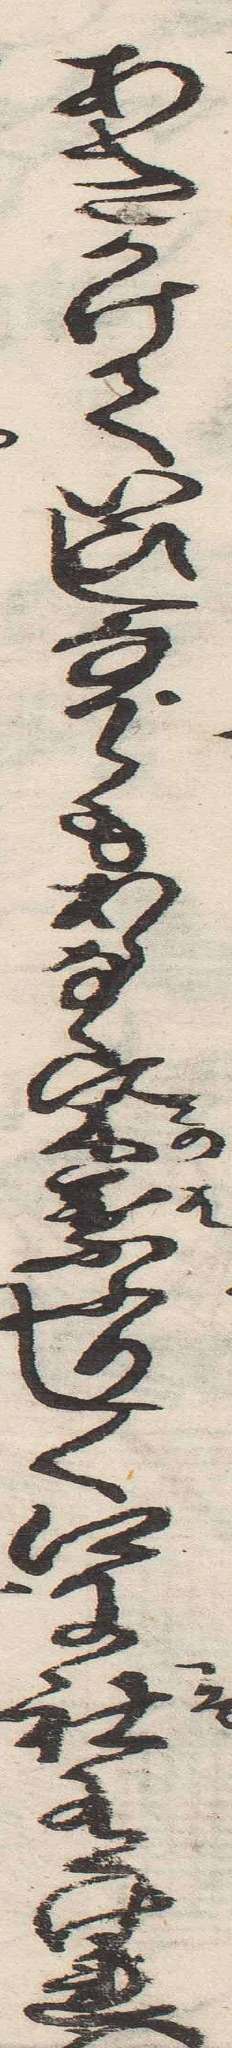あきかけていひしながらもあらなくに木葉ふりしく江に社有けれは
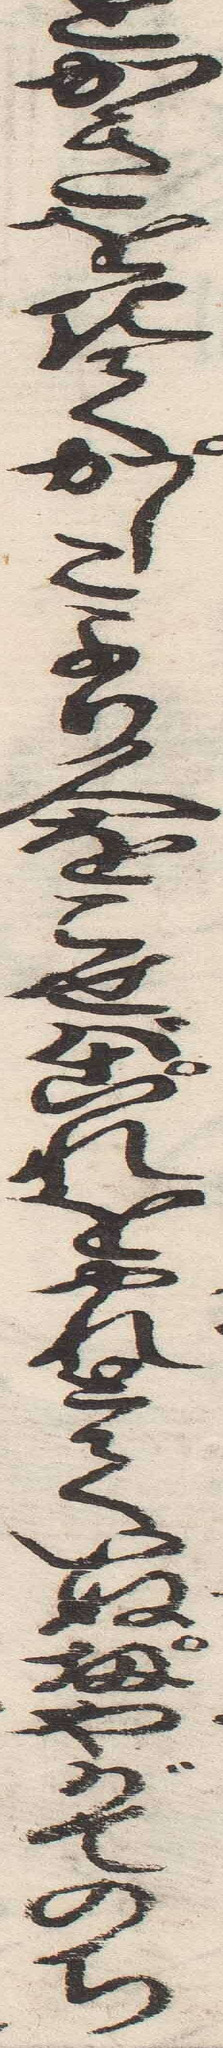とかきをきて。かしこより人をこせば。これをやれとていぬ。扨やがてのち
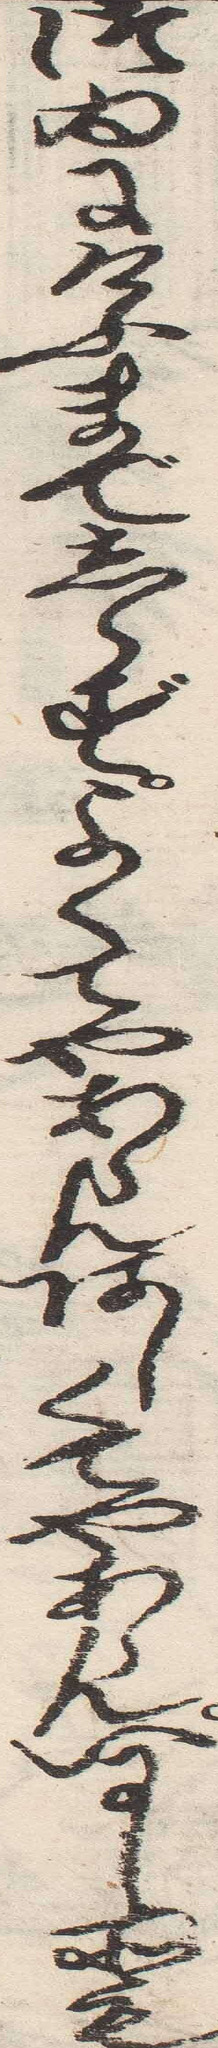つゐにけふまでしらず。よくてやあらんあしくてやあらん。いにし所も
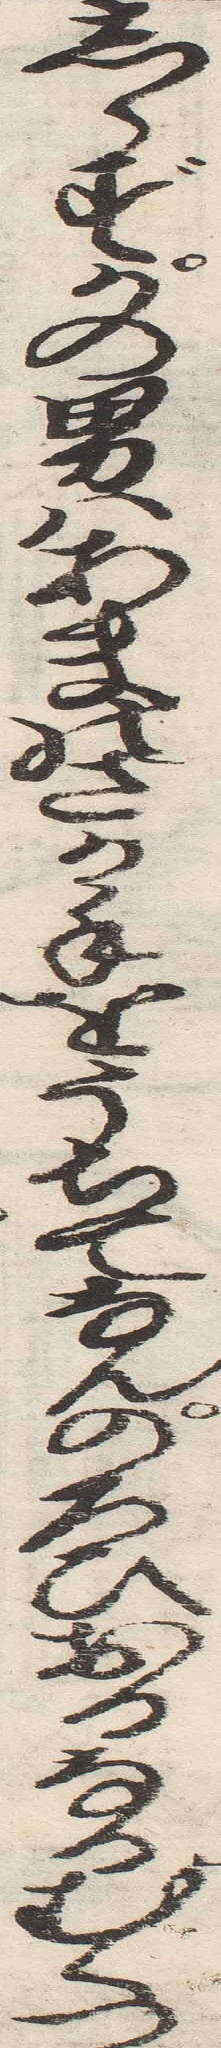しらず。かの男はあまのさか手をうちてなん。のろひおるなるむくつ
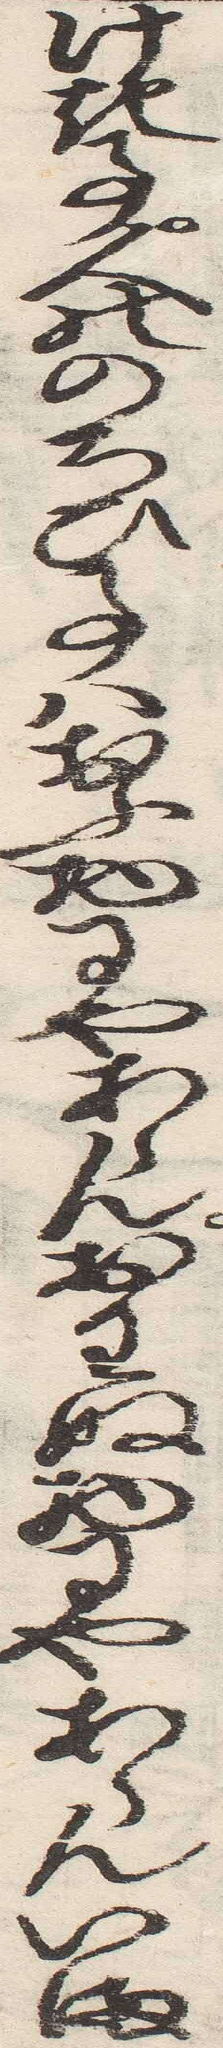けき事。人ののろひ事はおふ物にやあらん。おわぬ物にやあらんいま
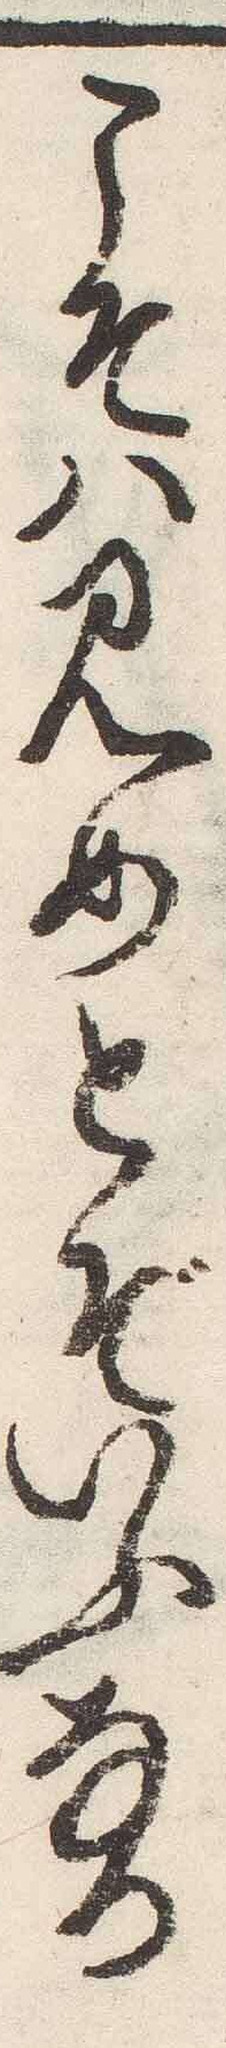こそは見めとぞいふなる
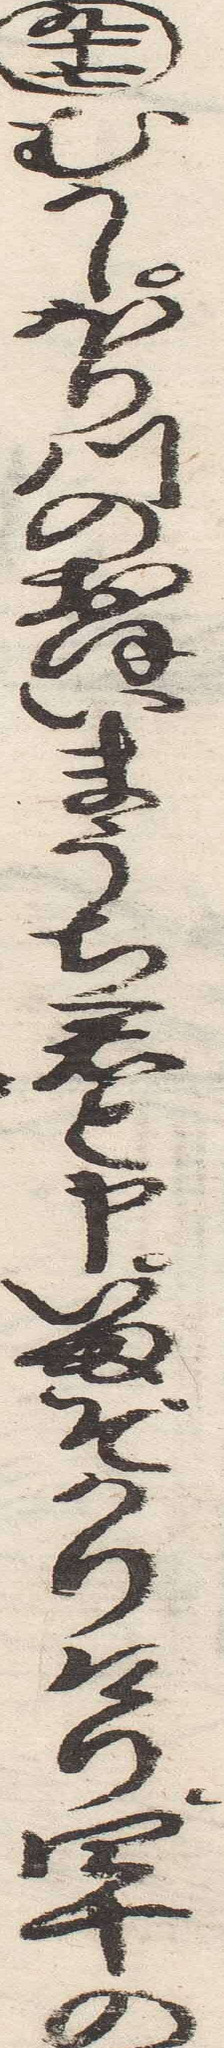九十七むかし。ほり川のおほいまうち君と申。いまぞかりけり。四十の
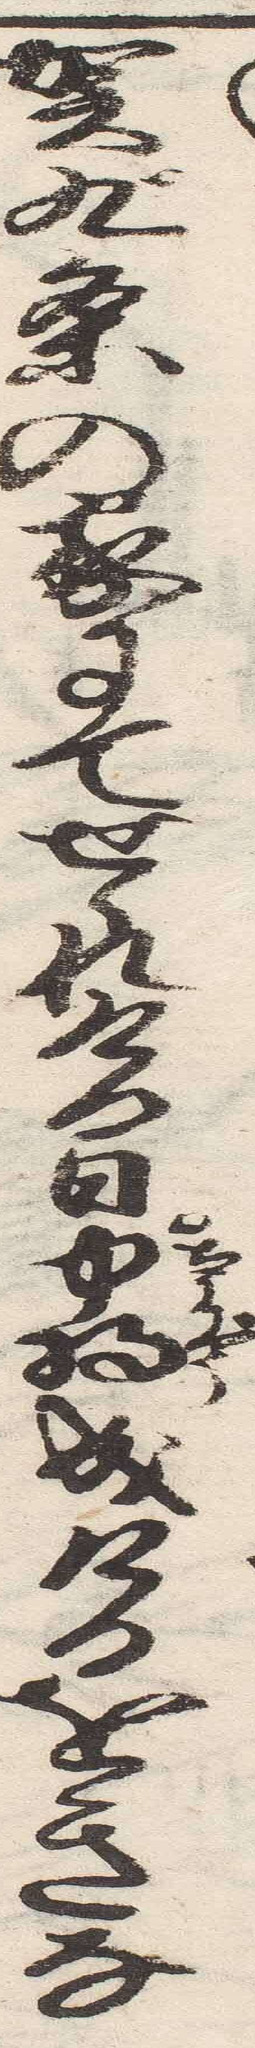賀。九条の家にてせられける日。中将成けるをきな
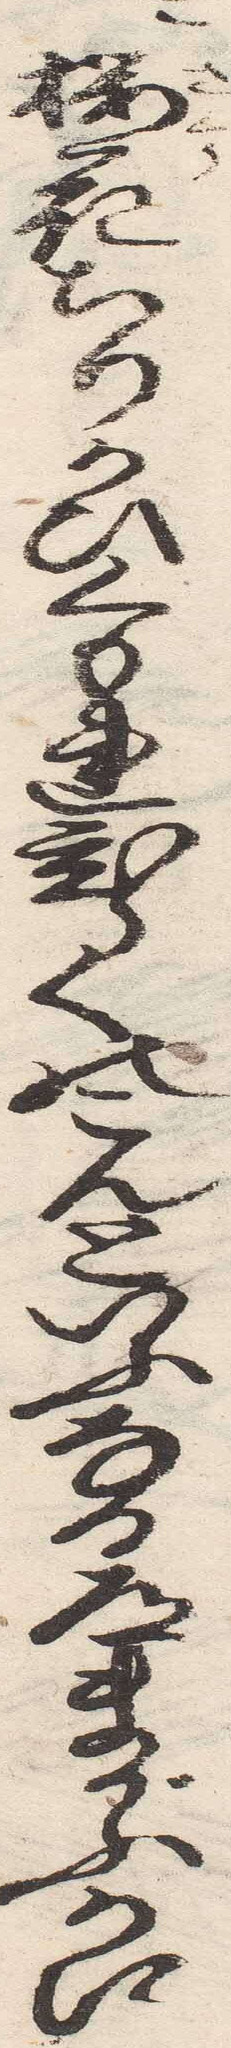古今桜花ちりかひくもれ老らくのこんといふなる道まがふかに
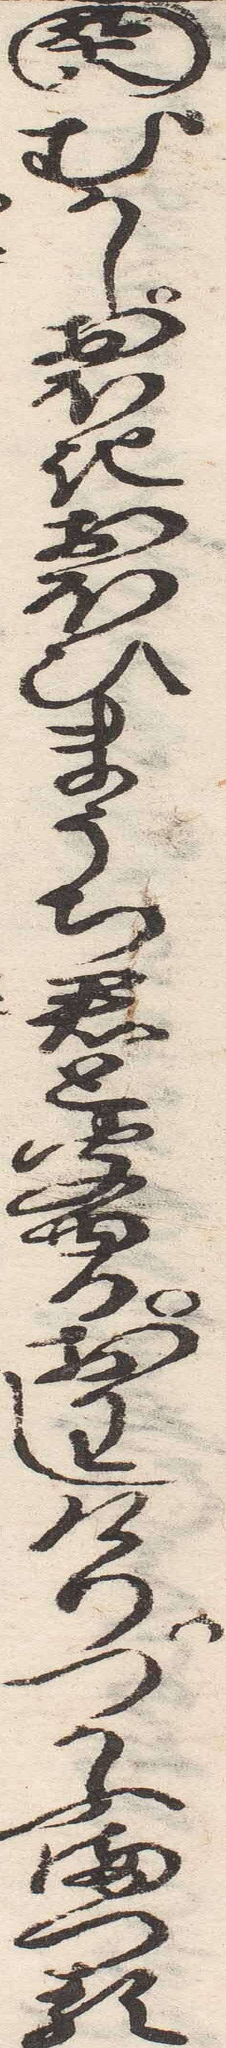九十八むかし。おほきおほひまうち君と聞ゆる。おわしけり。つかふまつる
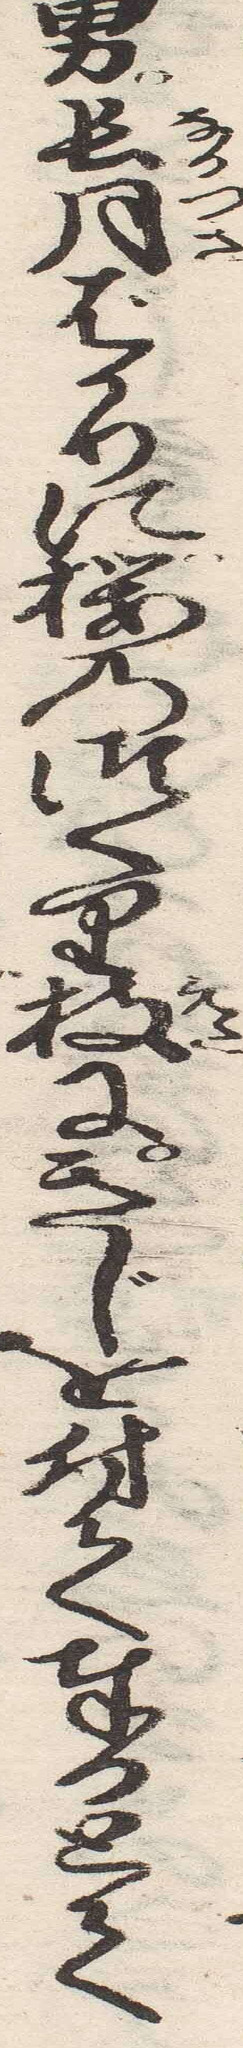男。長月ばかりに。桜のつくり枝に。きじを付て奉るとて
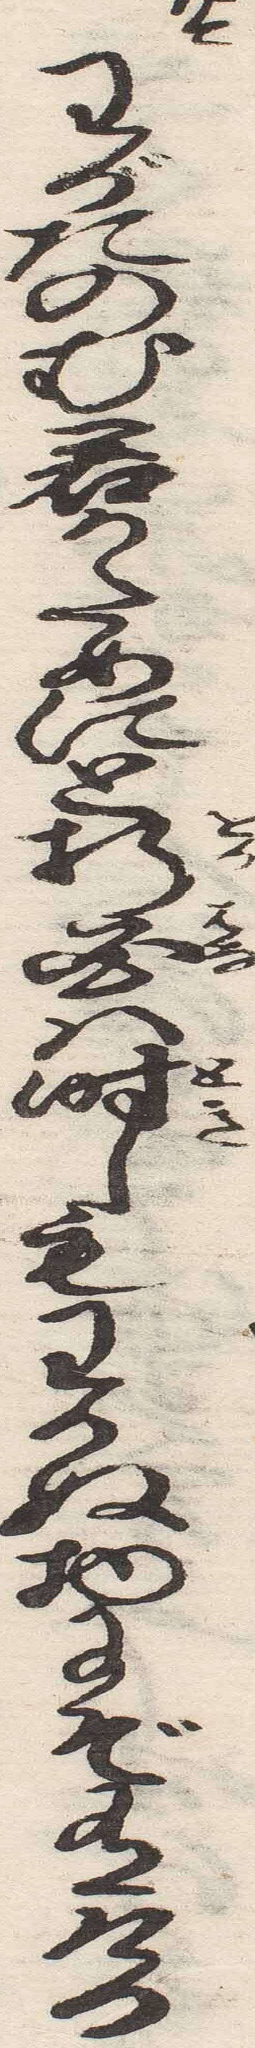古今わがたのむ君かためにと折花は時しもわかぬ物にぞ有ける
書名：伊勢物語
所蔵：東京学芸大学附属図書館 国文学研究資料館
